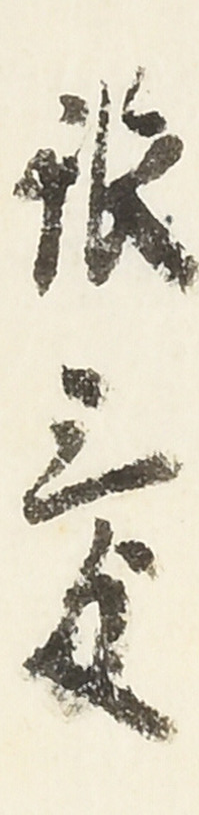銀三匁
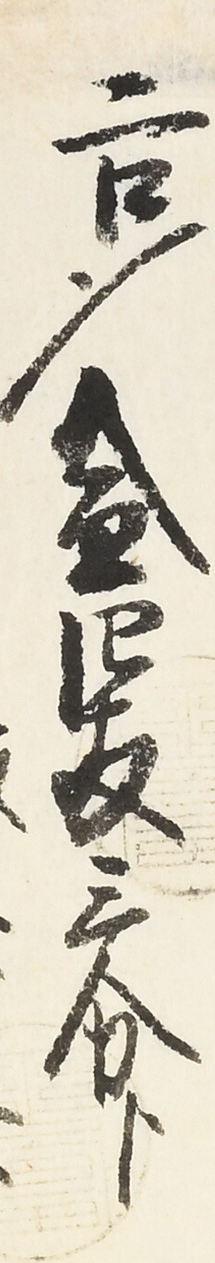二口〆金四両三分ト
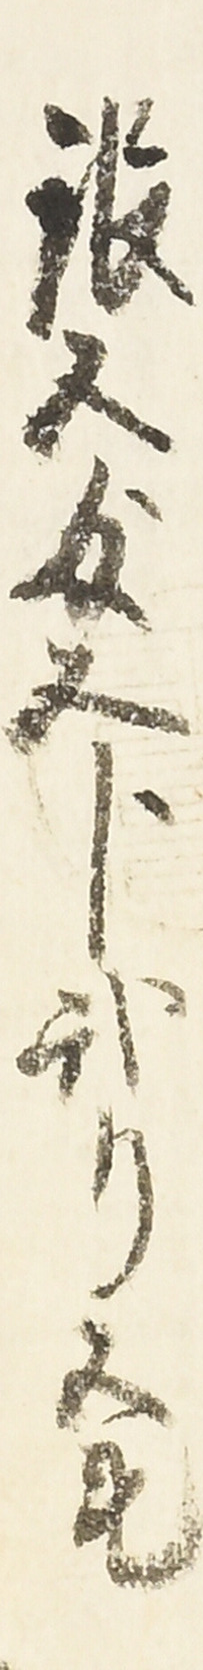銀五匁五分弐厘五毛
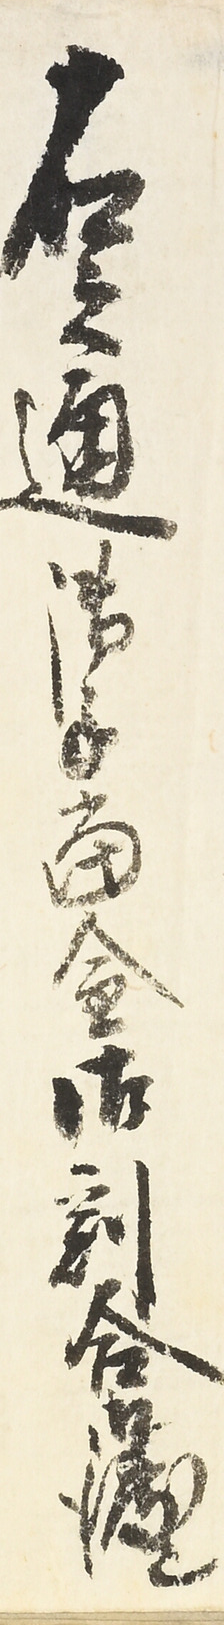右之通御手当金御割合御渡し
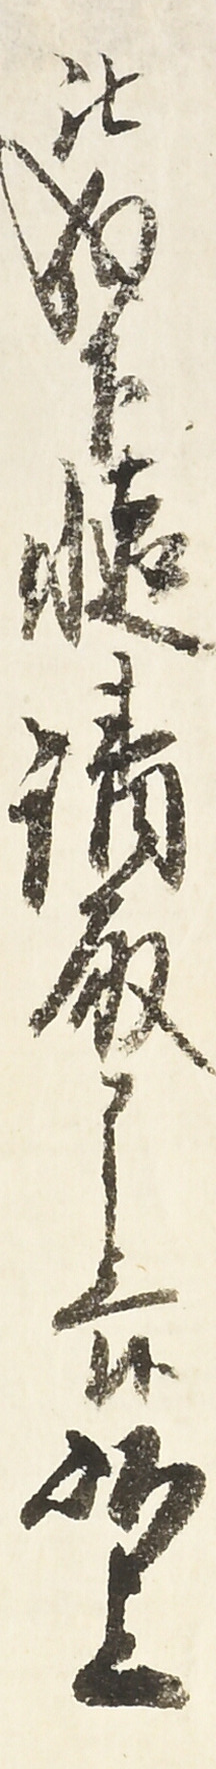被成下慥請取申上候以上
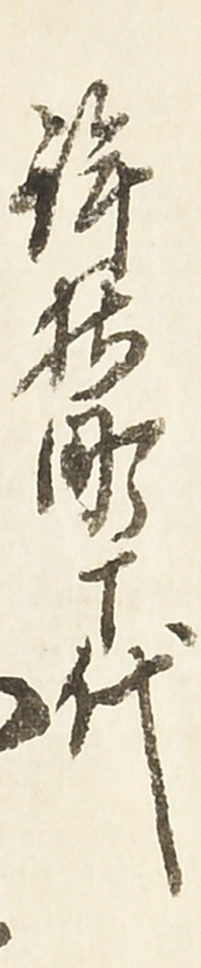下モ町丁代
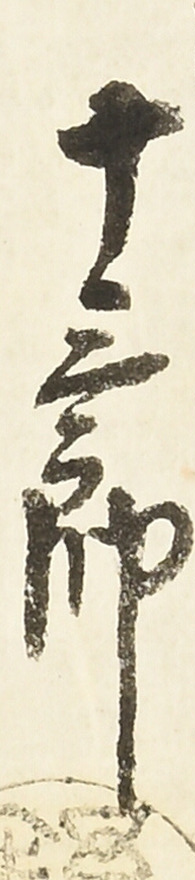十三郎
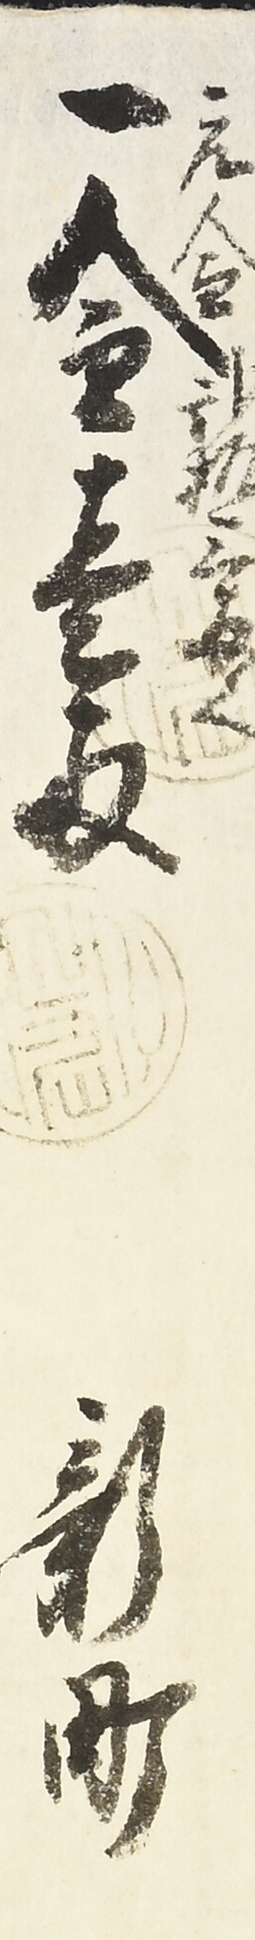一金壱両新町
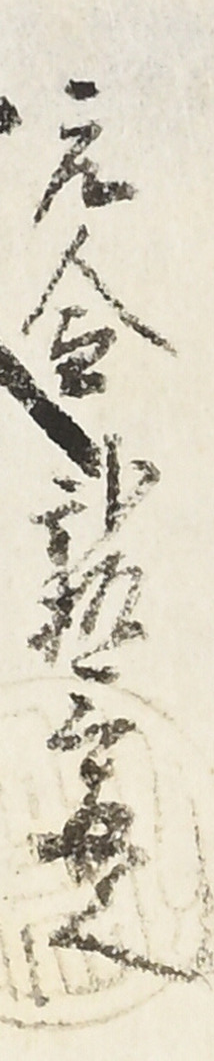元金弐拾三両也
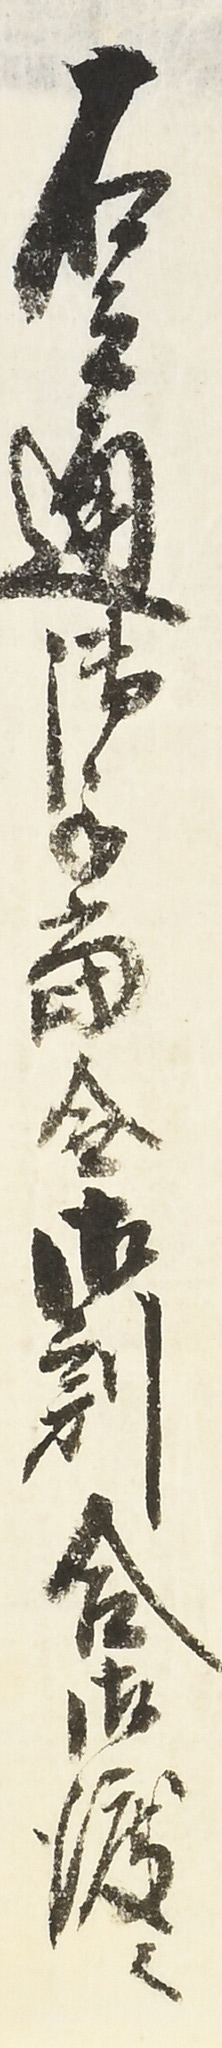右之通御手当金御割合御渡し
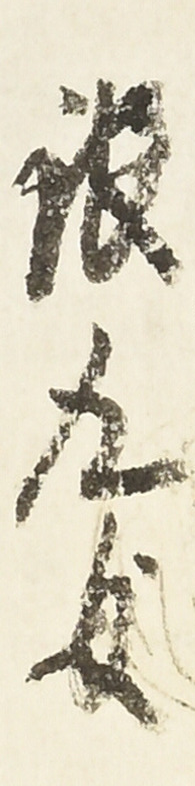銀九匁
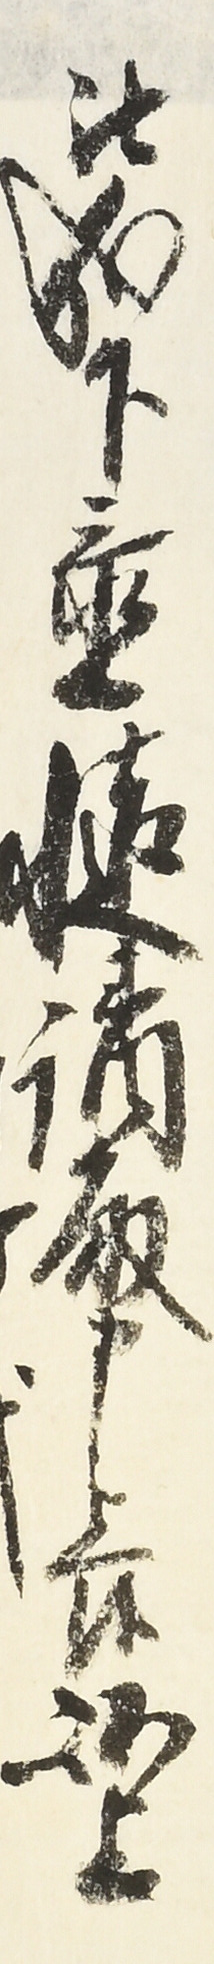被成下置慥請取申上候以上
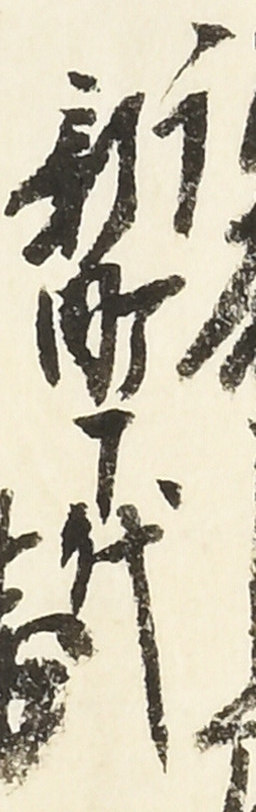新町丁代
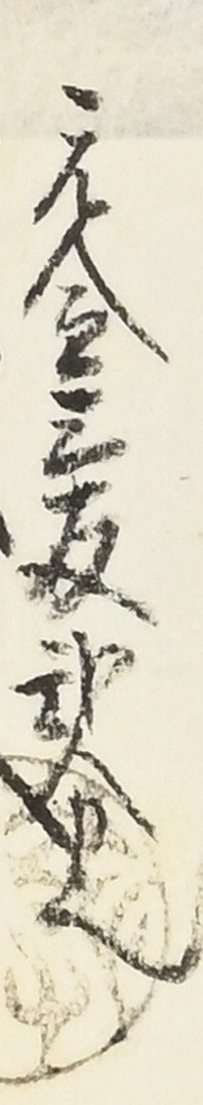元金三両弐分也
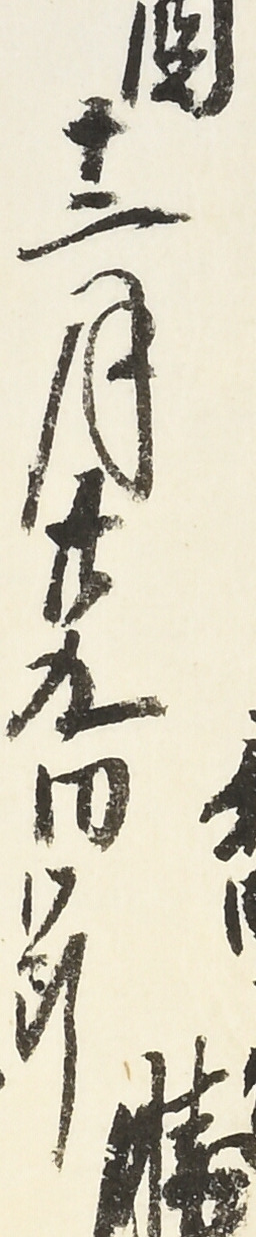十二月廿九日同断
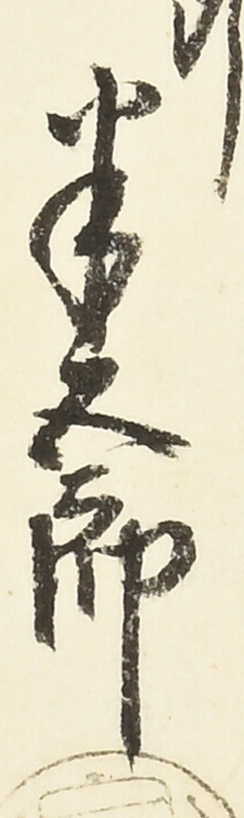半五郎
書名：御才覚金御利足割渡扣帳
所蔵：伊那市立高遠町図書館・合同会社AMANE
